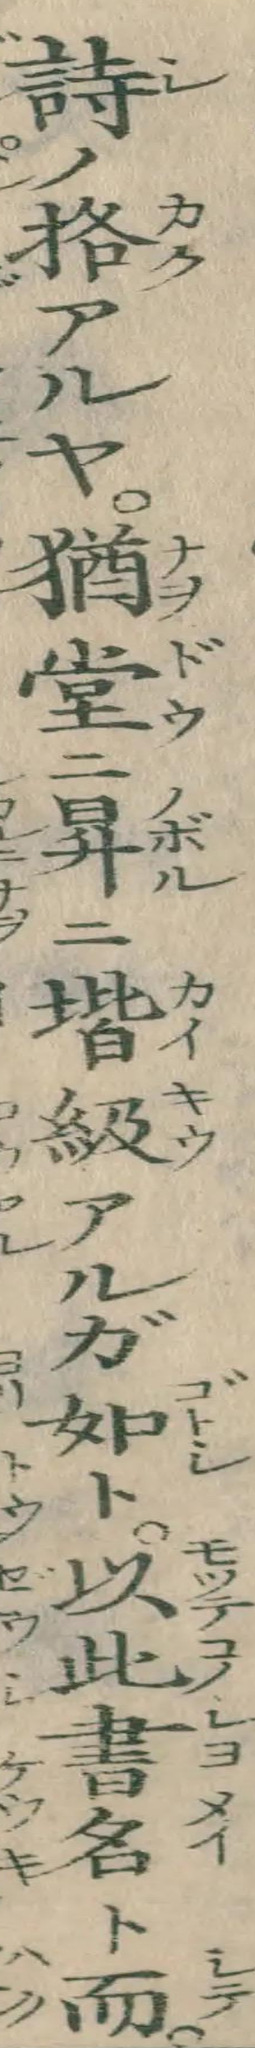詩ノ格アルヤ。猶堂ニ昇ニ階級アルガ如ト。以此書名ト而。
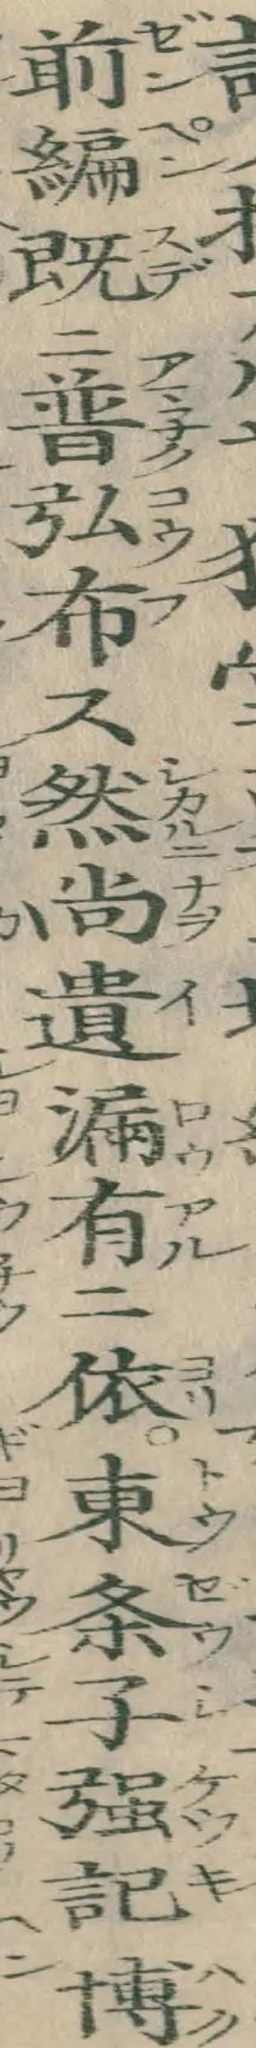前編既ニ普弘布ス然尚遺漏有ニ依。東条子強記博
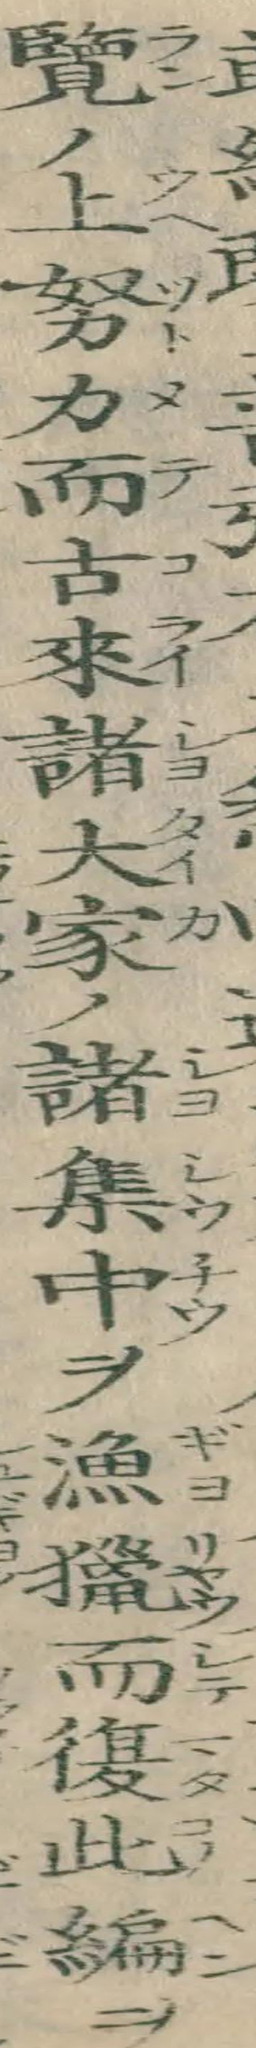覧ノ上努力而古来諸大家ノ諸集中ヲ漁猟而復此編ヲ
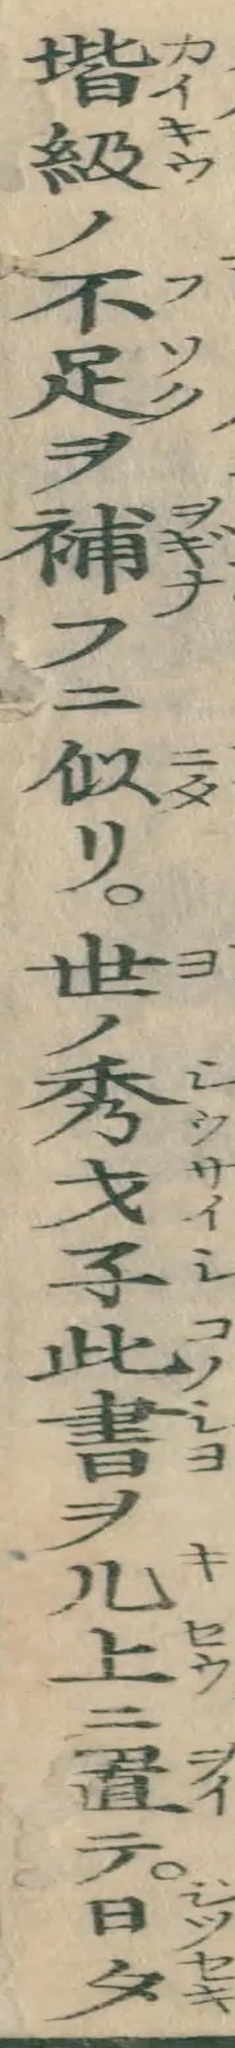階級ノ不足ヲ補フニ似リ。世ノ秀才子此書ヲ几上ニ置テ。日夕

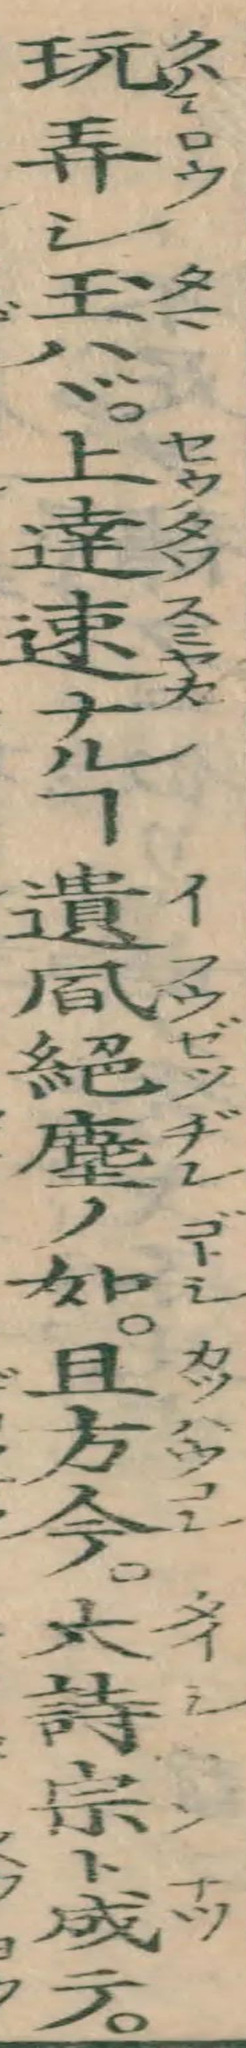玩弄シ玊ハヾ。上達速ナルコト遺風絶塵ノ如。且方今。大詩宗ト成テ。
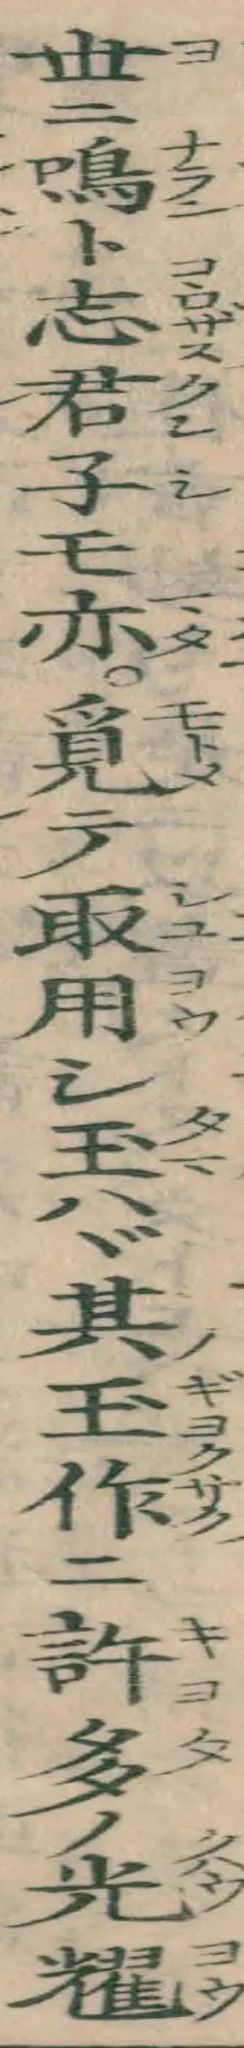世ニ鳴ト志君子モ亦。覓テ取用シ玊ハヾ其玊作ニ許多ノ光耀
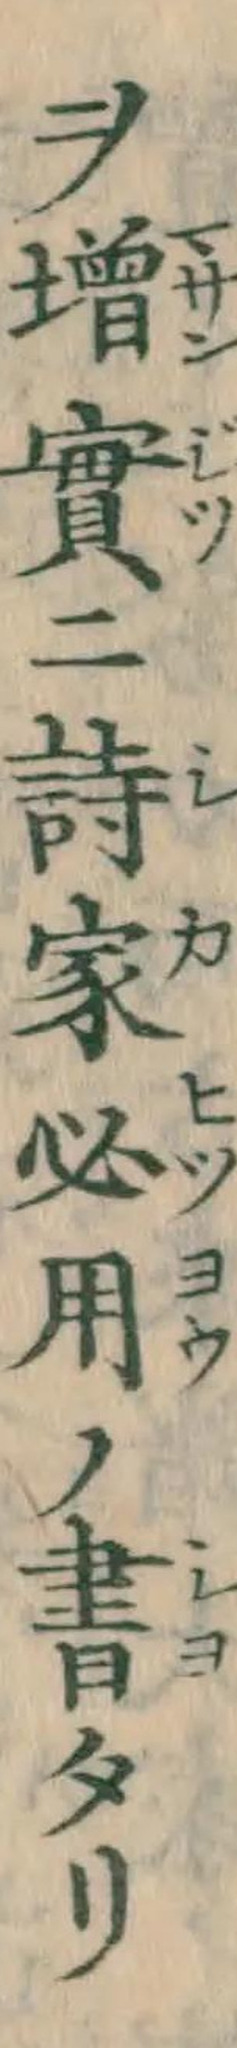ヲ増実ニ詩家必用ノ書タリ
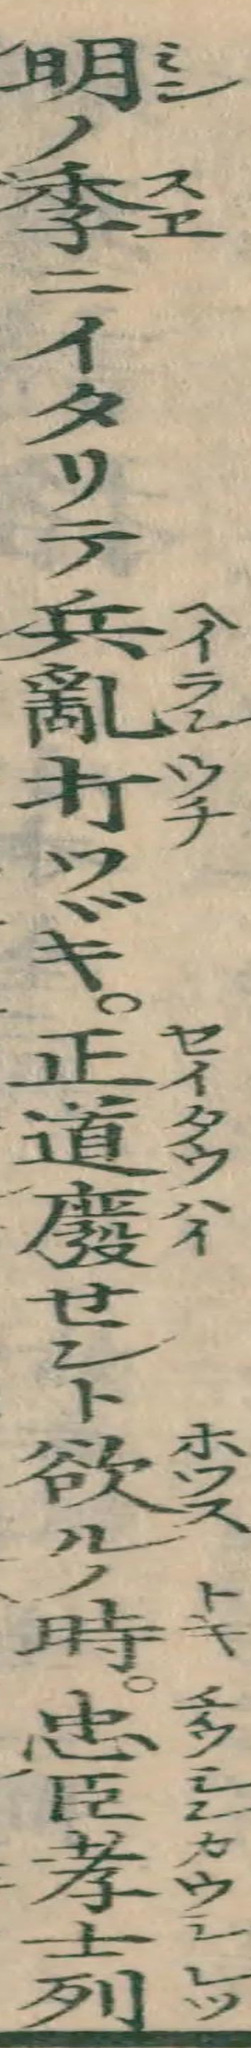明ノ季ニイタリテ兵乱打ツヾキ。正道廃セント欲ルノ時。忠臣孝士列
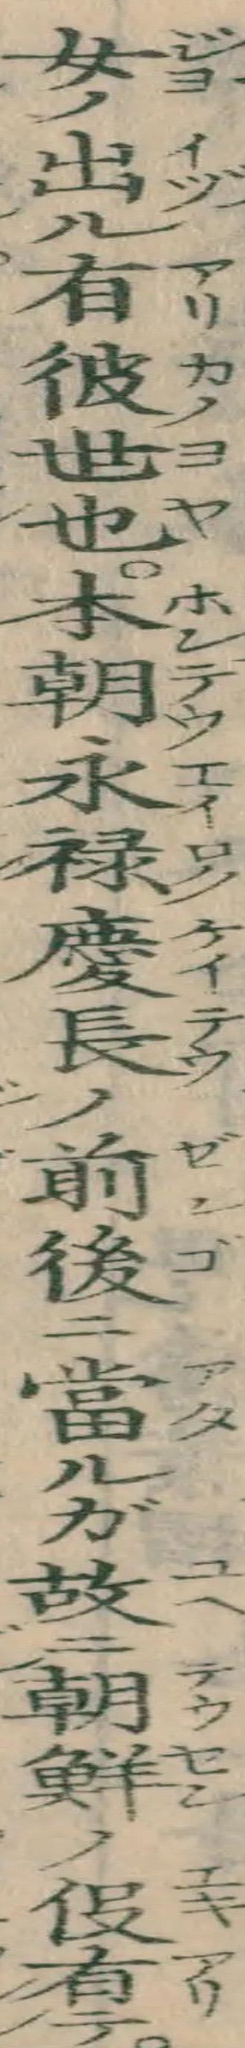女ノ出ル有彼世也。本朝永禄慶長ノ前後ニ当ルガ故ニ朝鮮ノ役有テ。
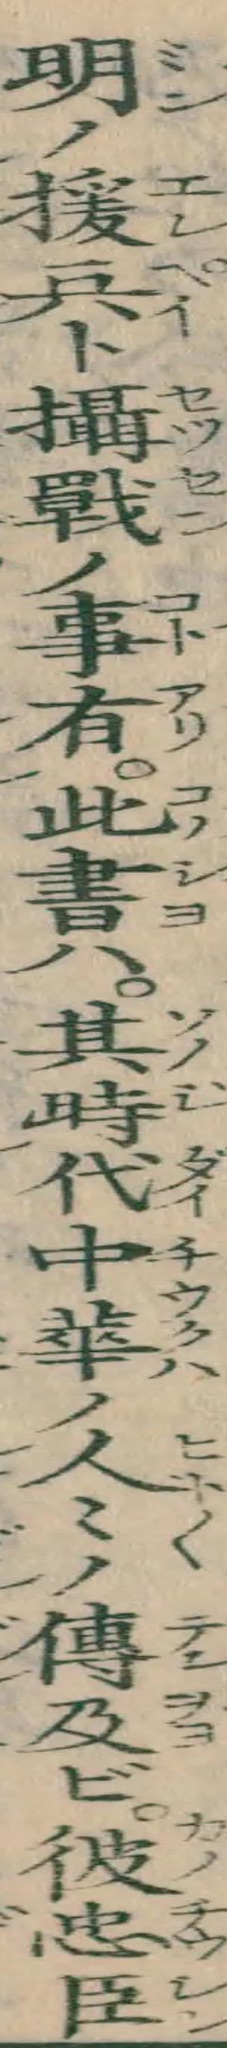明ノ援兵ト摂戦ノ事有。此書ハ。其時代中華ノ人々ノ伝及ビ。彼忠臣
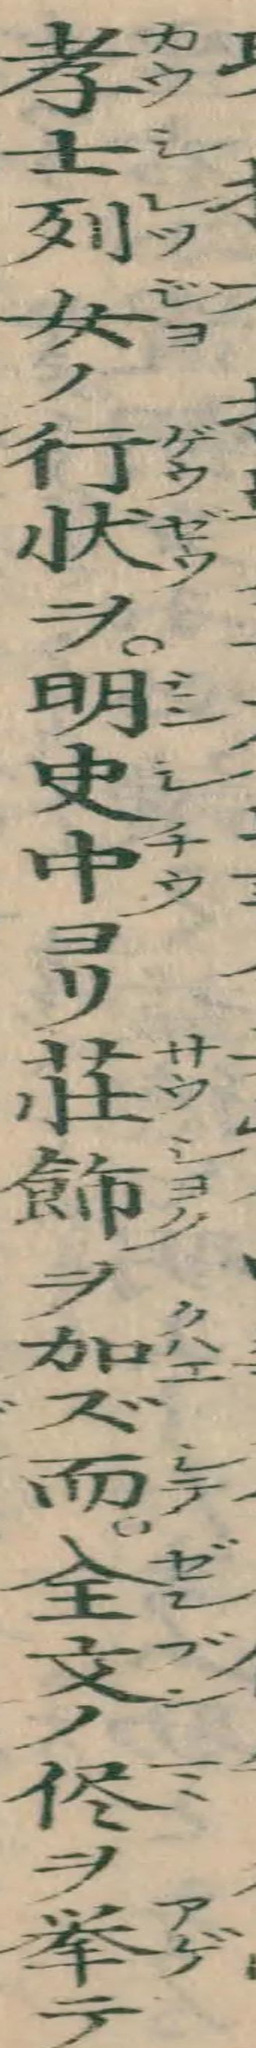孝士列女ノ行状ヲ。明史中ヨリ荘飾ヲ加ズ而。全文ノ儘ヲ挙テ
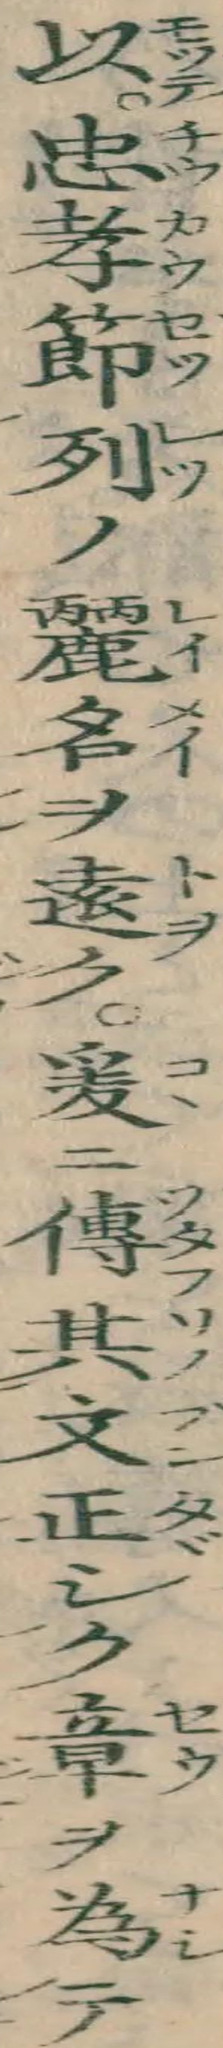以。忠孝節列ノ麗名ヲ遠ク。爰ニ伝其文正シク章ヲ為テ
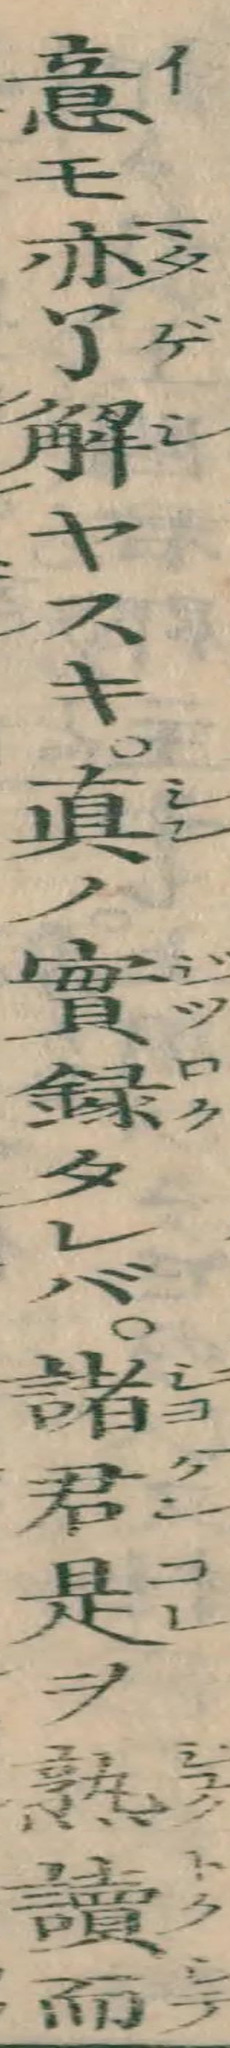意モ亦了解ヤスキ。真ノ実録タレバ。諸君是ヲ熟読而
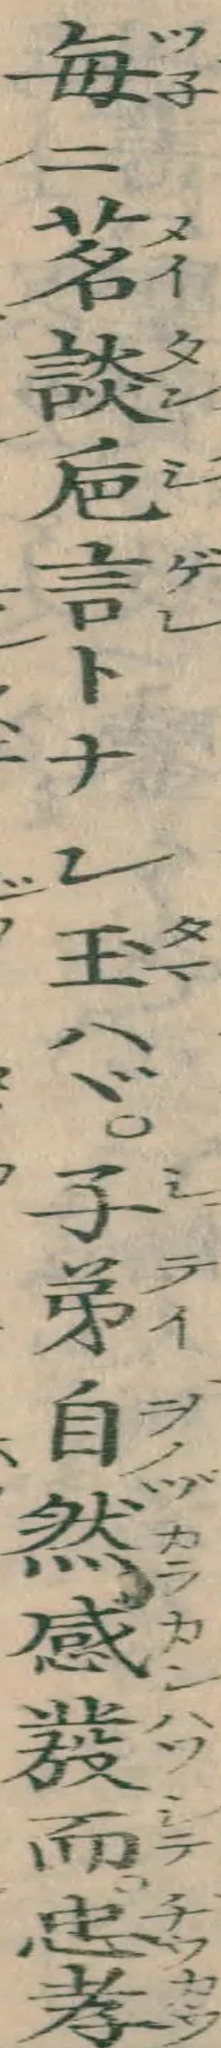毎ニ茗談卮言トナン玊ハヾ。子弟自然感発而。忠孝
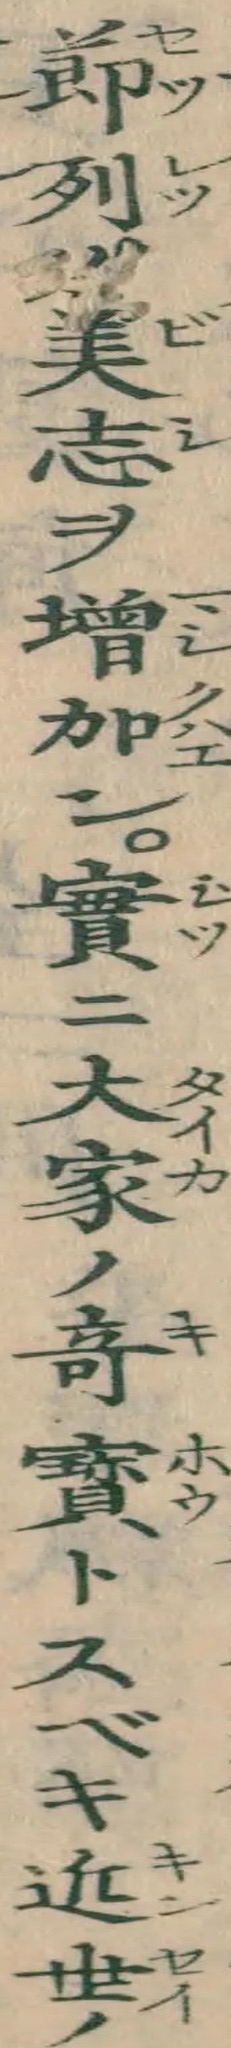節列美志ヲ増加ン。実ニ大家ノ奇宝トスベキ近世ノ
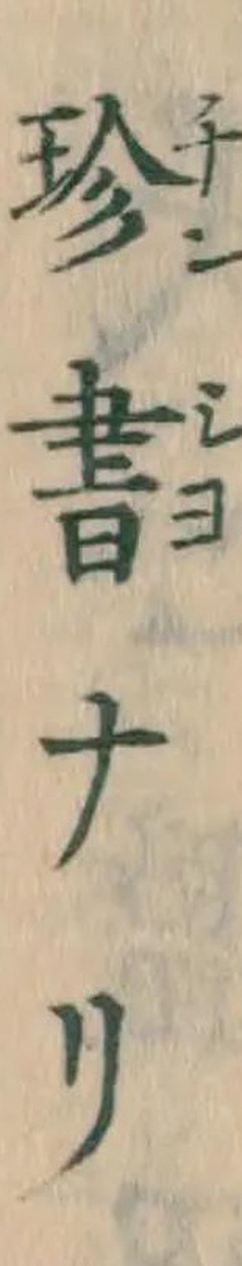珍書ナリ
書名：これこれ草 2巻. [2]
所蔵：国立国会図書館 National Diet Library, JAPAN
